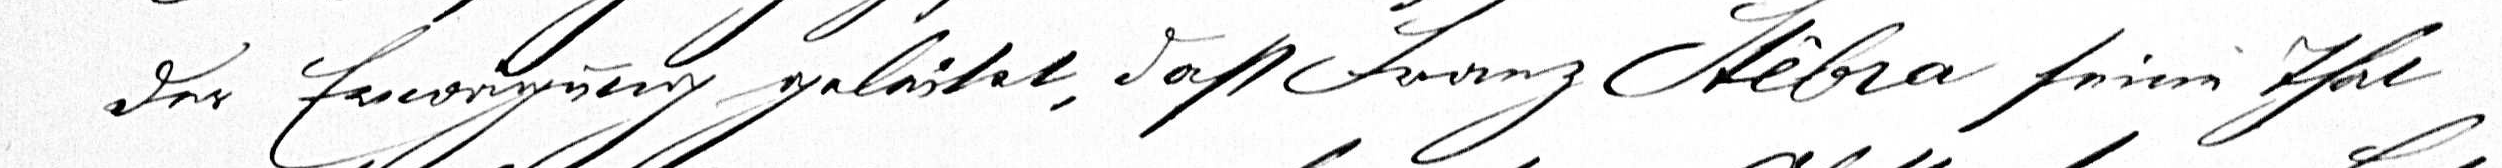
der Erwägung geleitet, daß Franz Stebra seine That
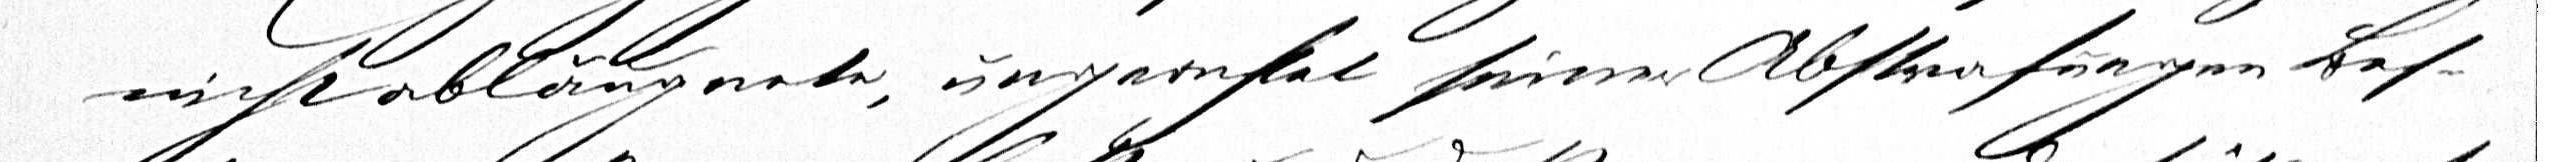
nicht abläugnete, ungarnstet seiner Abstraffungen Bes¬
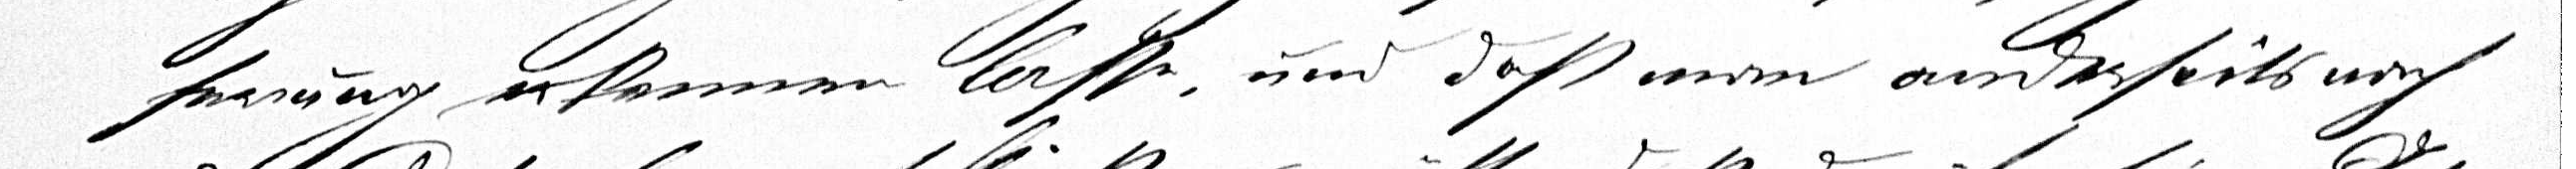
serung erkennen lasse, und daß man anderseits nach
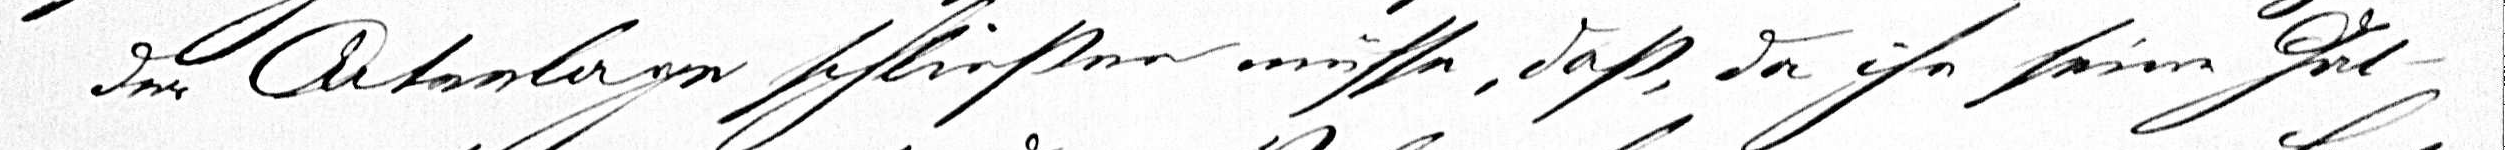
der xxtenlage schließen musse, daß, da ihn seine Gat¬
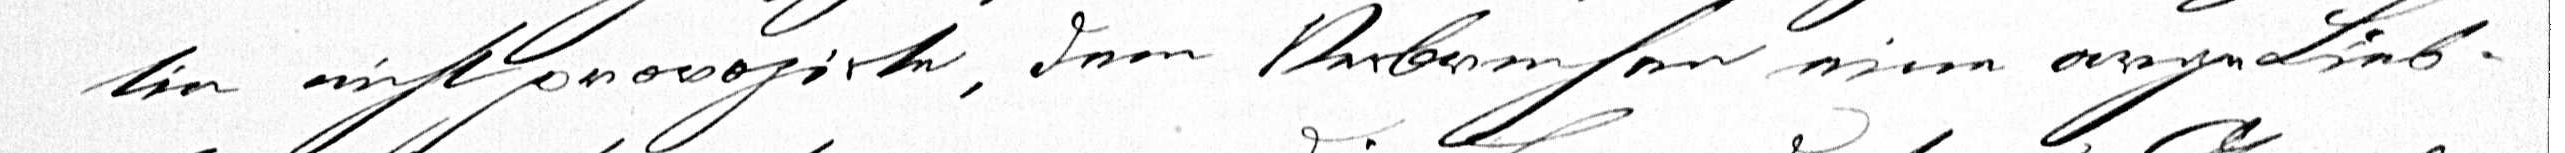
tin nicht provozirte, dem Verbrechen eine arge Lieb¬
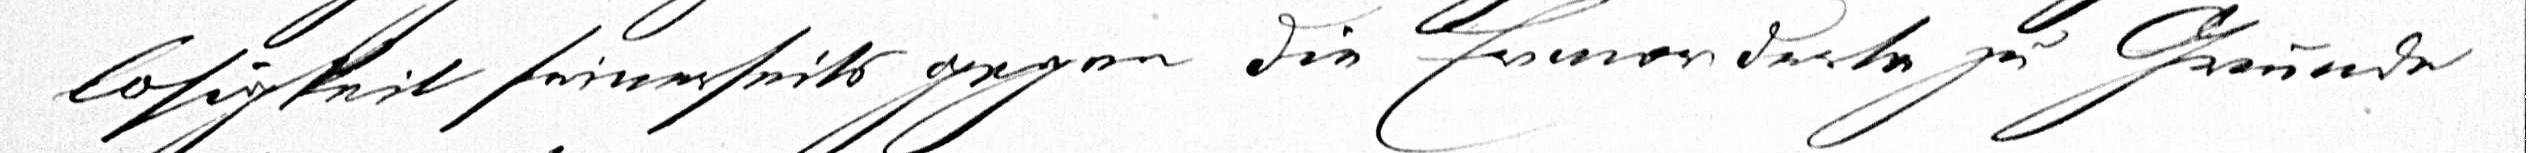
losigkeit seinerseits gegen die Ermorderte zu Grunde
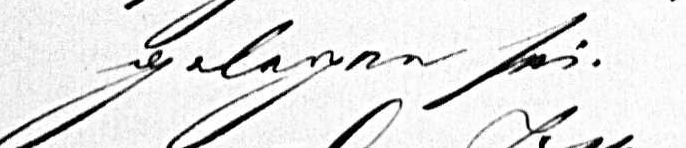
gelegen sei.
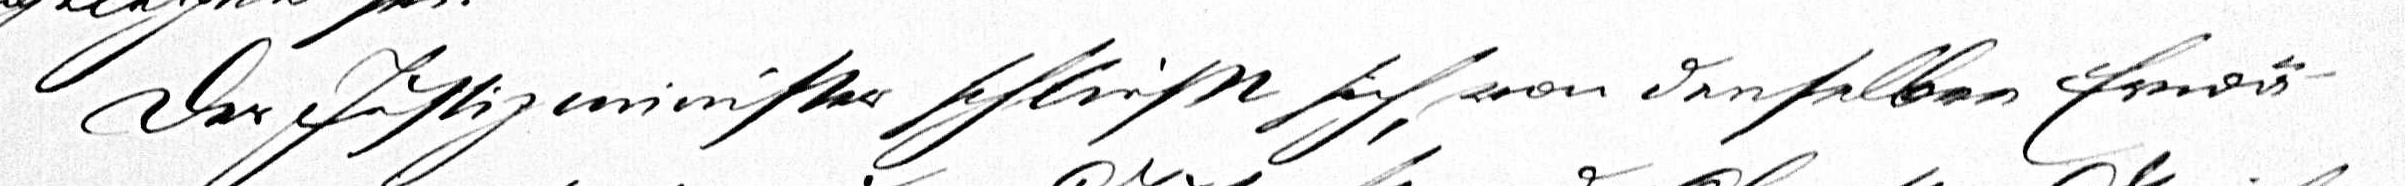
Der Justizminister schließt sich, von denselben Erwä¬
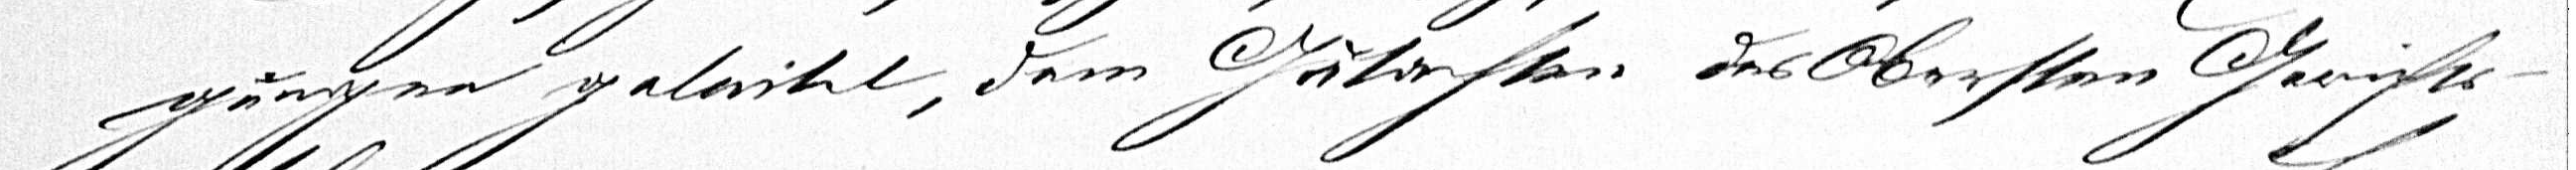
gungen geleitet, dem Gutachten des Obersten Gerichts¬
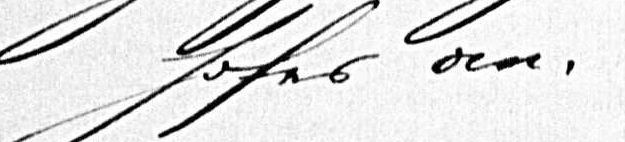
hofes an.
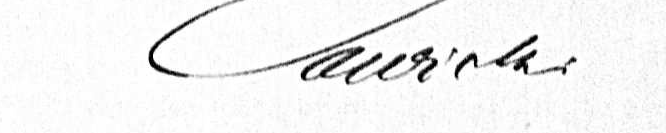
Sawicki
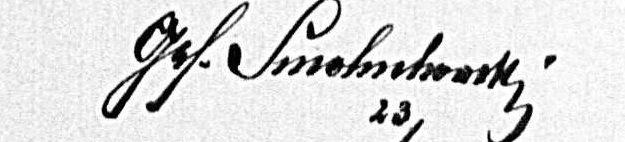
Ges. Smolnchowcki
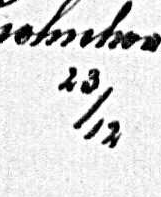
23/12
